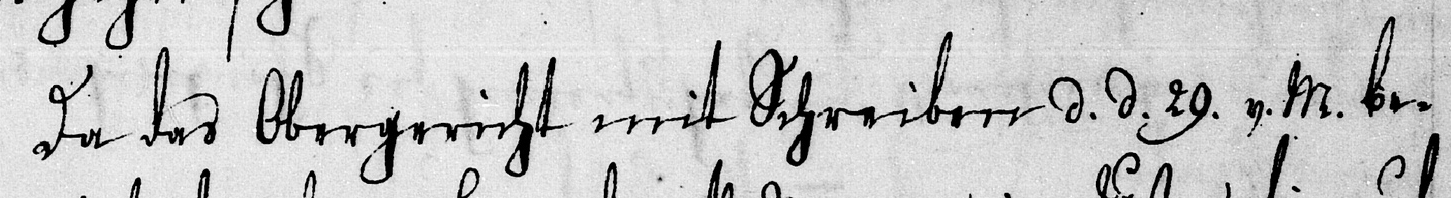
Da das Obergericht mit Schreiben d. d. 29. v. M. be¬
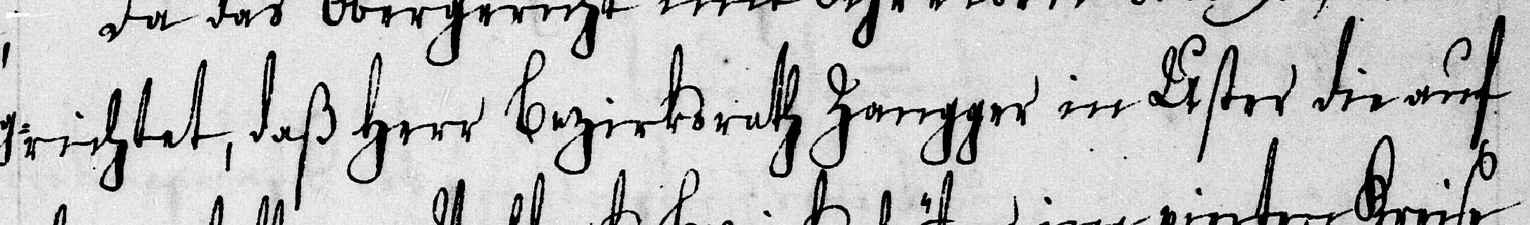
richtet, daß Herr Bezirksrath Zangger in Uster die auf
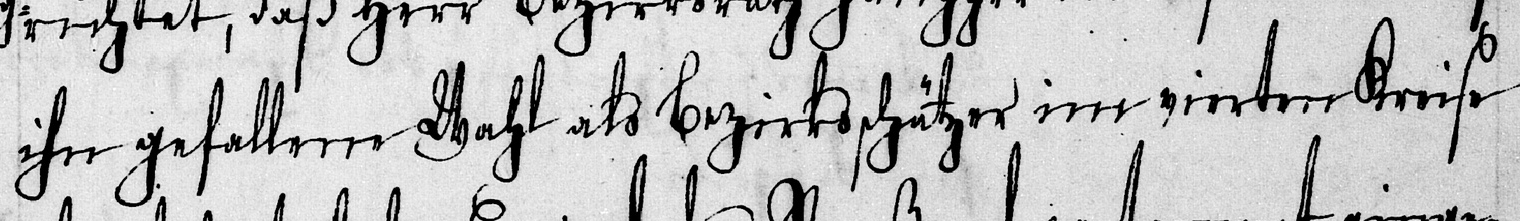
ihn gefallene Wahl als Bezirksschätzer im vierten Kreise
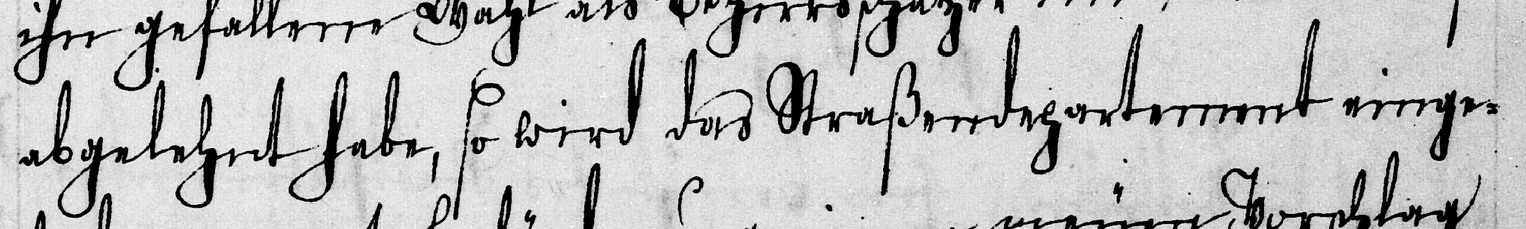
abgelehnt habe, so wird das Straßendepartement einge¬
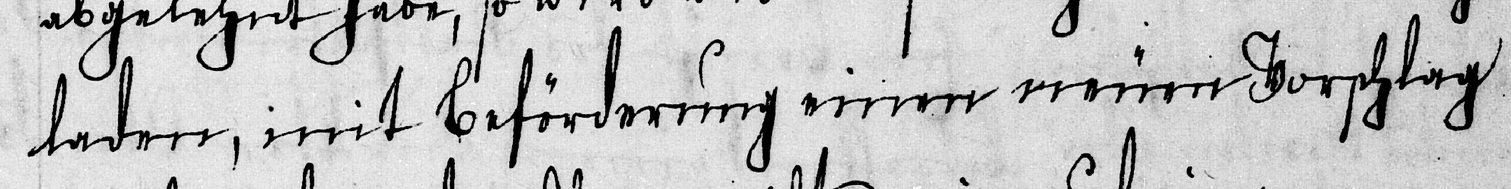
laden, mit Beförderung einen neuen Vorschlag
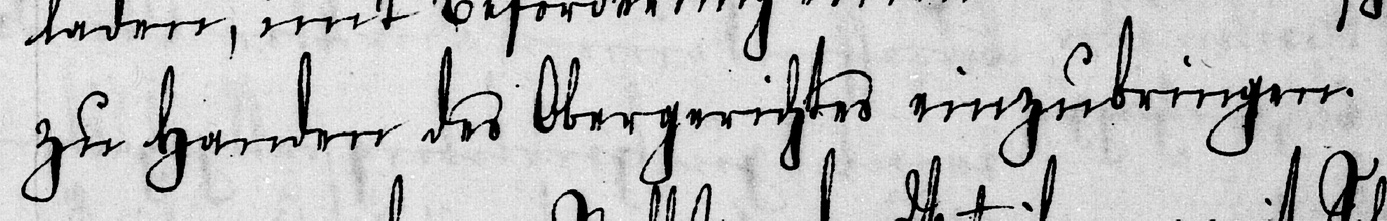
zu Handen des Obergerichtes einzubringen.
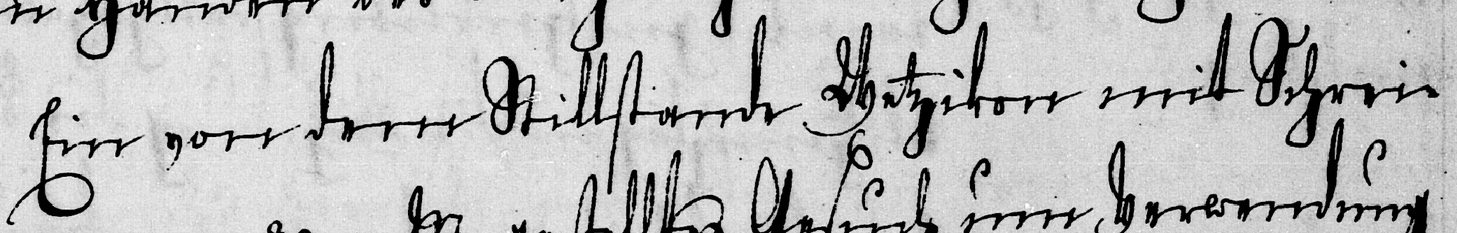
Ein von dem Stillstande Wetzikon mit Schrei¬
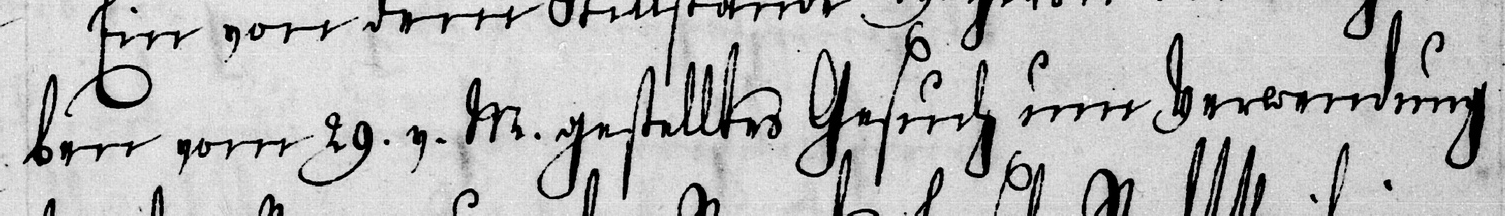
ben vom 29. v. M. gestelltes Gesuch um Verwendung
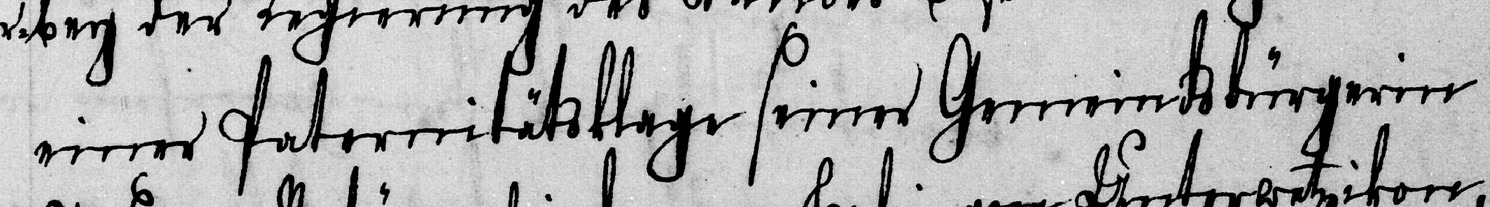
einer Paternitätsklage seiner Gemeindsbürgerin
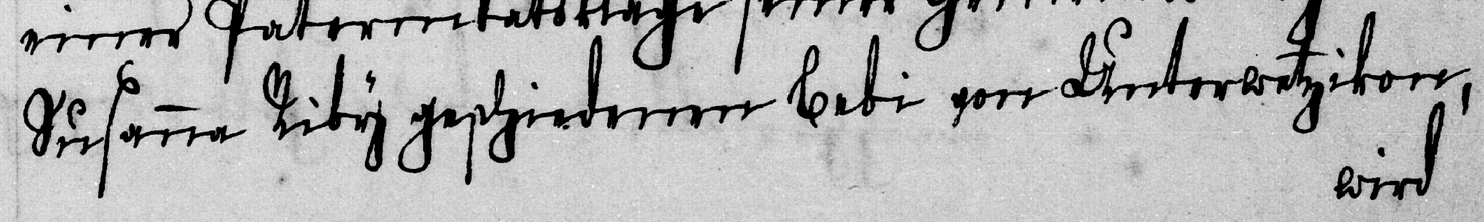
Susanna Riby geschiedene Bebi von Unterwetzikon,
